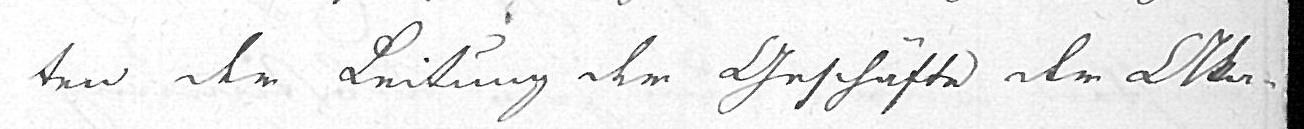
ten der Leitung der Geschäfte der Aka-
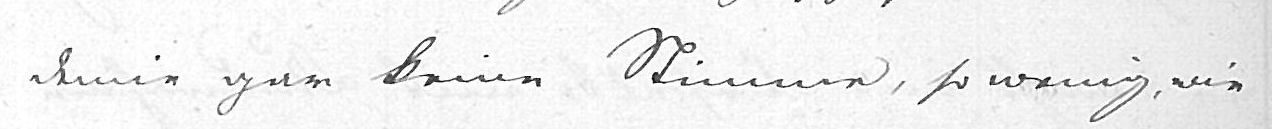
demie gar keine Stimme, so wenig, wie
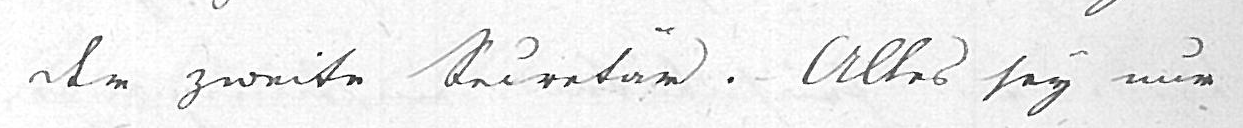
der zweite Secretär. Alles sey nur
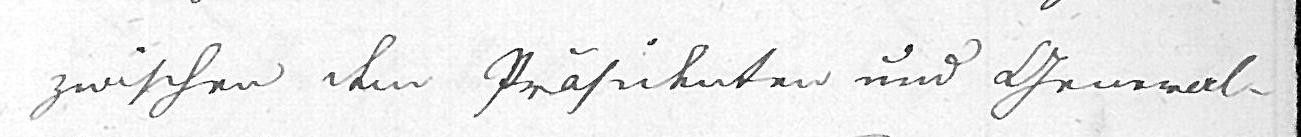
zwischen dem Präsidenten und General-
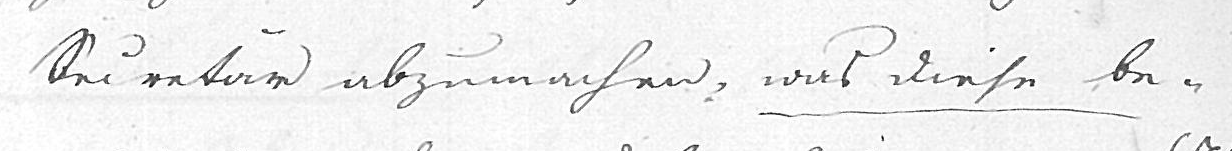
Secretär anzumache, was diese be-
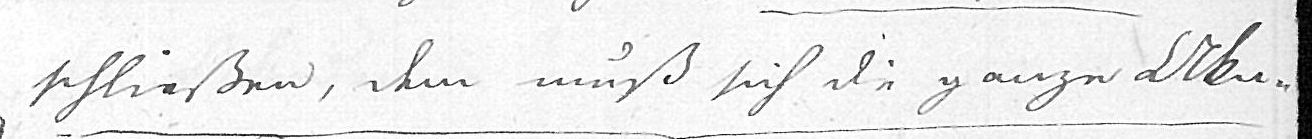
schließen, dem muß sich die ganze Aka-
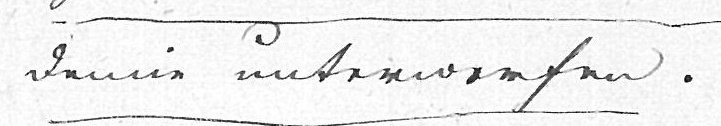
demie unterwerfen.
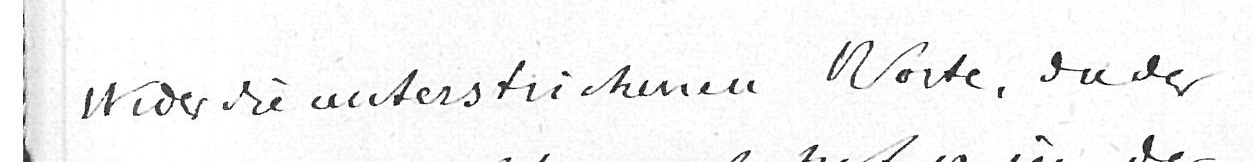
Wider die unterstrichenen Worte, da der
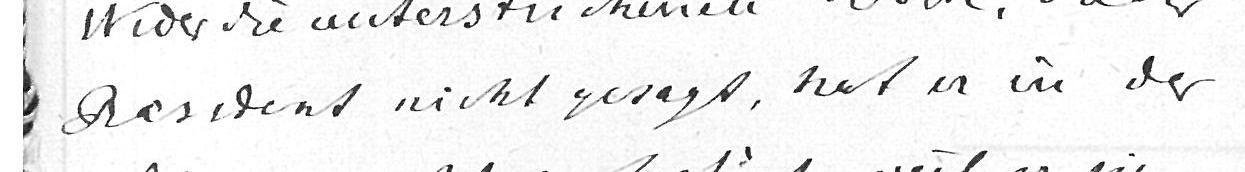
Praesident nicht gesagt, hat er in der
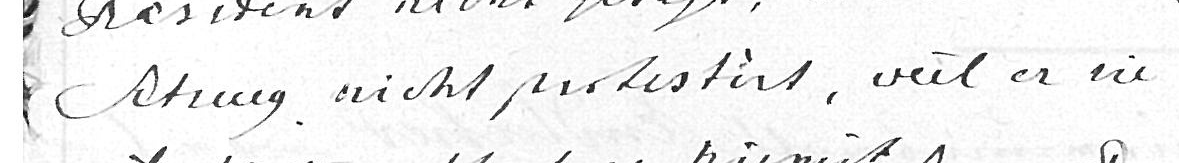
Sitzung nicht protestirt, weil er sie
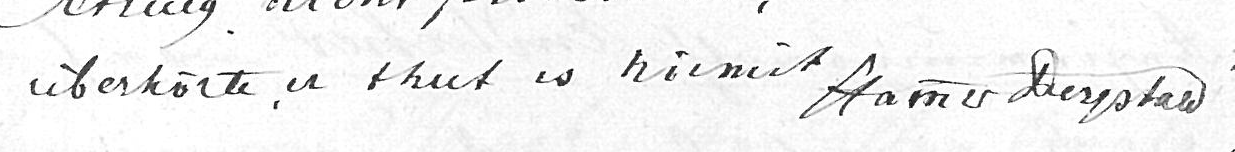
überhörte, er thut es hiemit Hammer-Purgstall
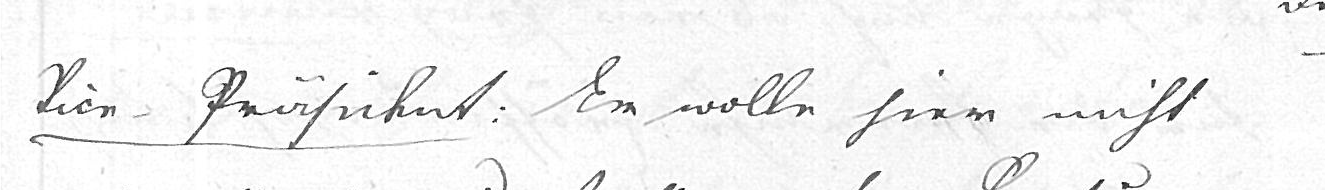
Vice-Präsident: Er wolle hier nicht
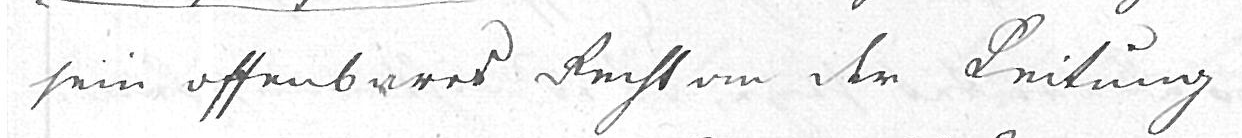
sein offenbares Recht an der Leitung
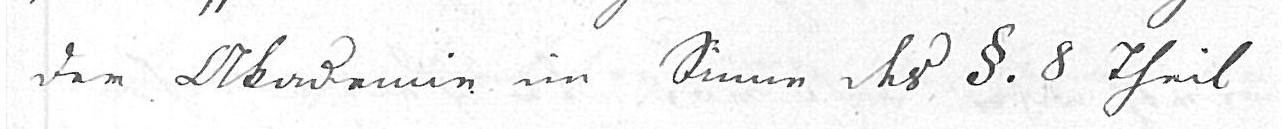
der Akademie im Sinne des §. 8 Theil
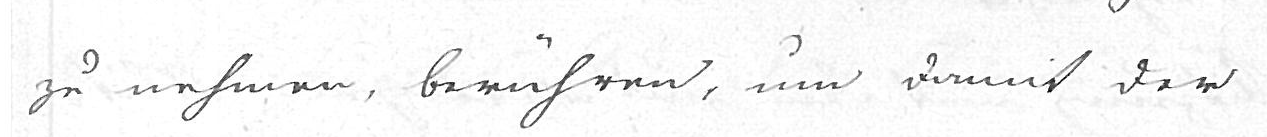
zu nehmen, berühren, um damit der
